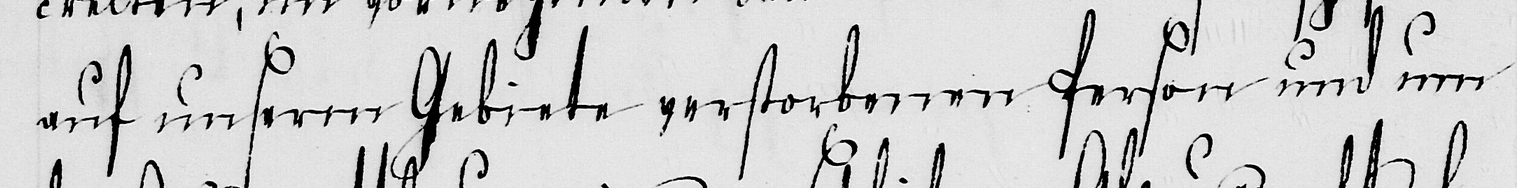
auf unserm Gebiete verstorbenen Person und um
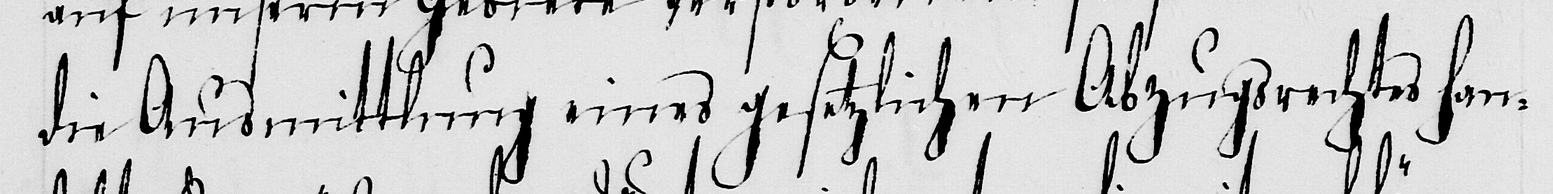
die Ausmittlung eines gesetzlichen Abzugsrechtes han¬
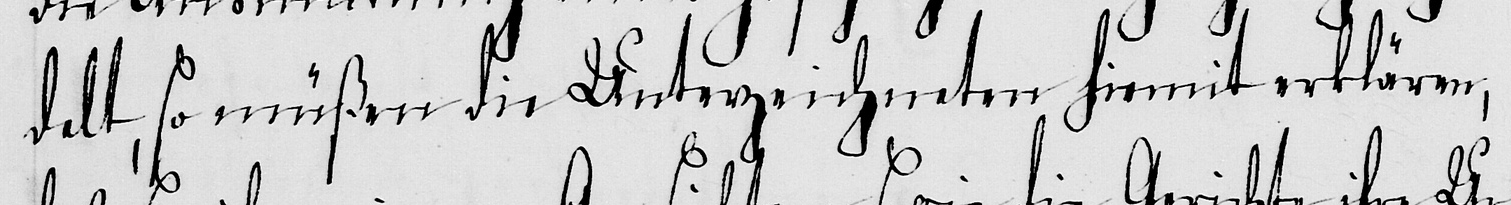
delt, so müßen die Unterzeichneten hiemit erklären,
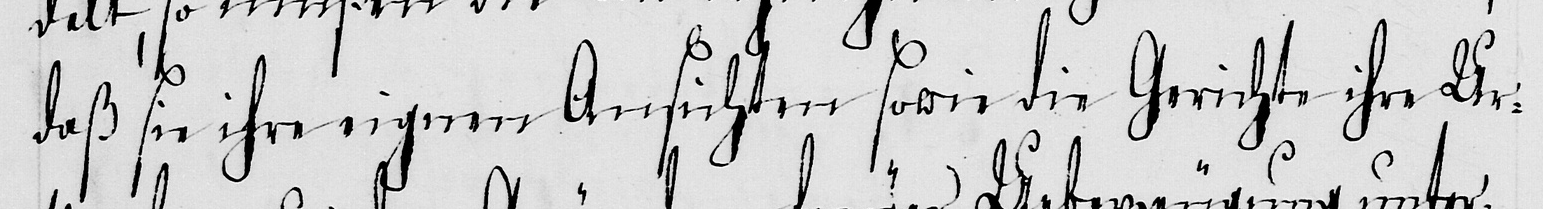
daß sie ihre eignen Ansichten sowie die Gerichte ihre Ur¬
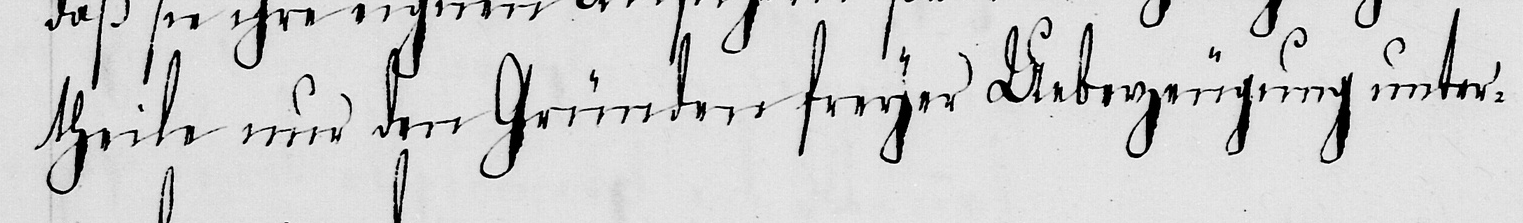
theile nur den Gründen freyer Ueberzeugung unter¬
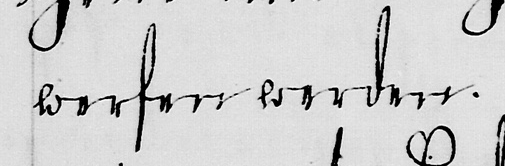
werfen werden.
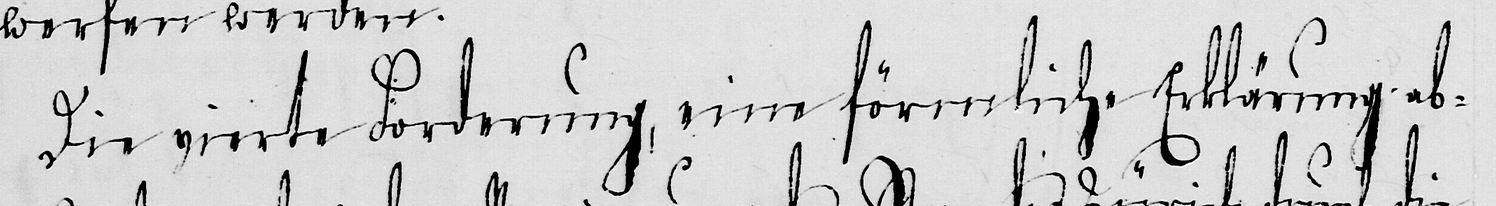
Die vierte Forderung, eine förmliche Erklärung ab¬
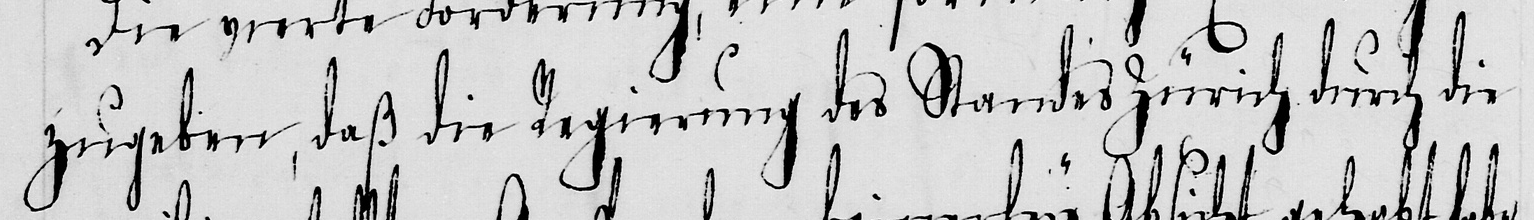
zugeben, daß die Regierung des Standes Zürich durch die
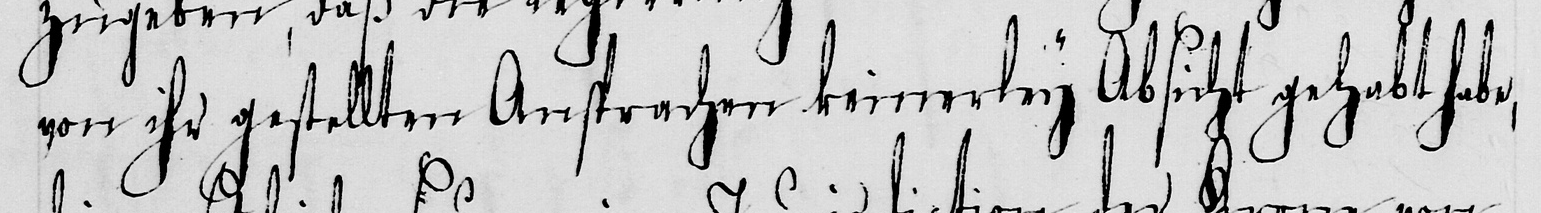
von ihr gestellten Ansprachen keinerley Absicht gehabt habe,
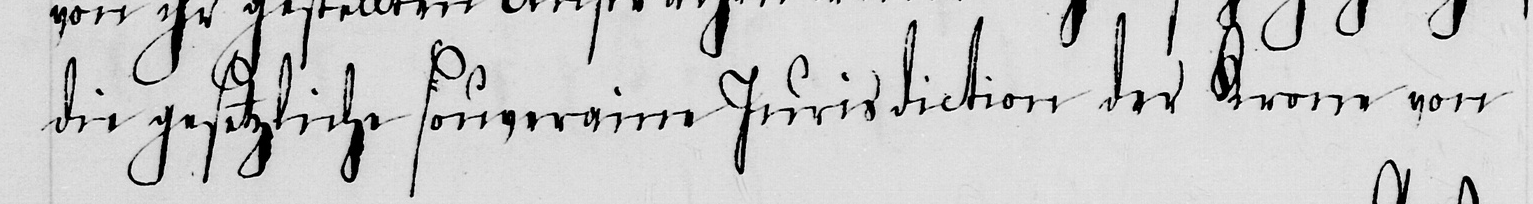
die gesetzliche souveraine Jurisdiction der Krone von
